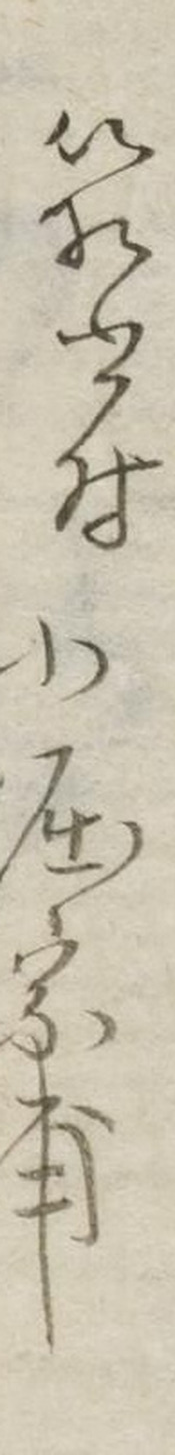箱書付小堀宗甫
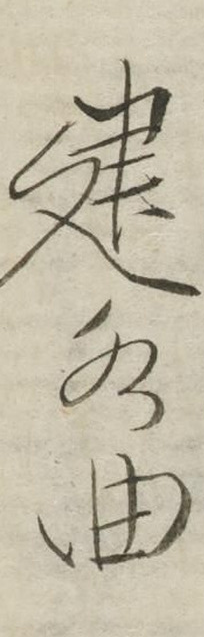建水曲

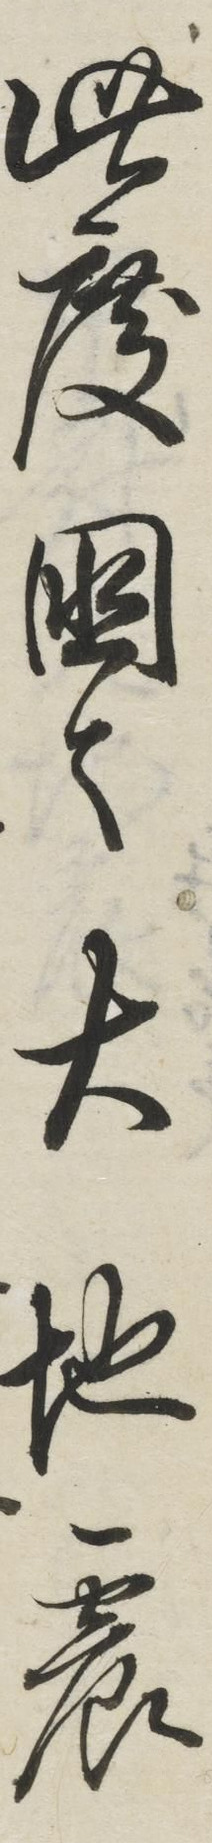此度国〻大地震
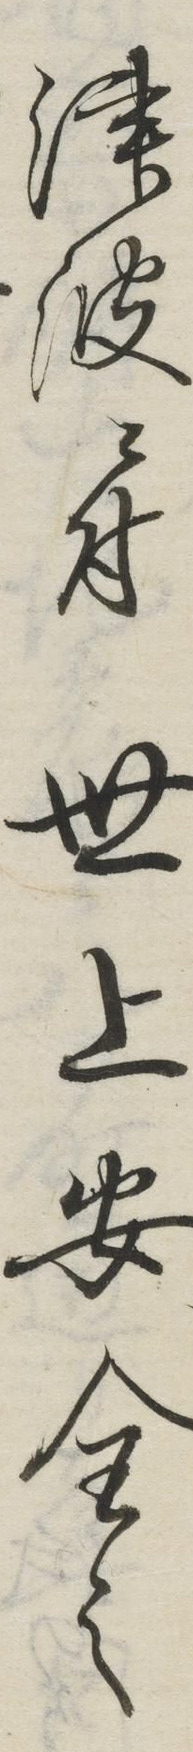津波ニ付世上安全之
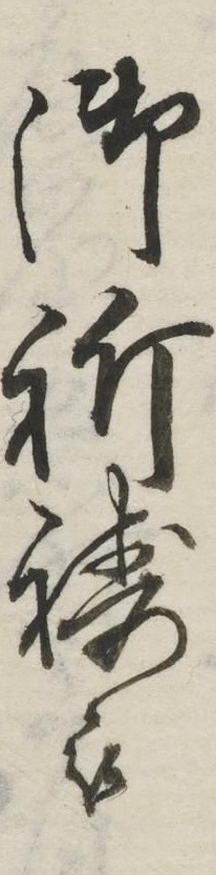御祈祷被
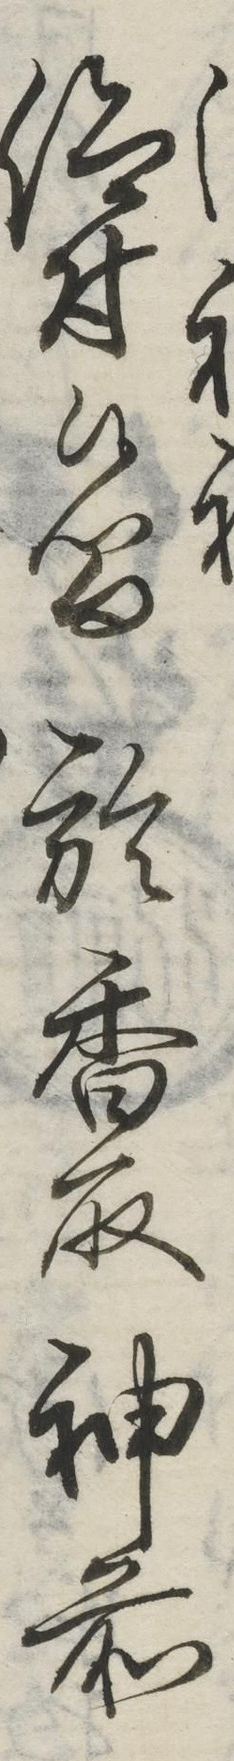仰付候間於香取神前
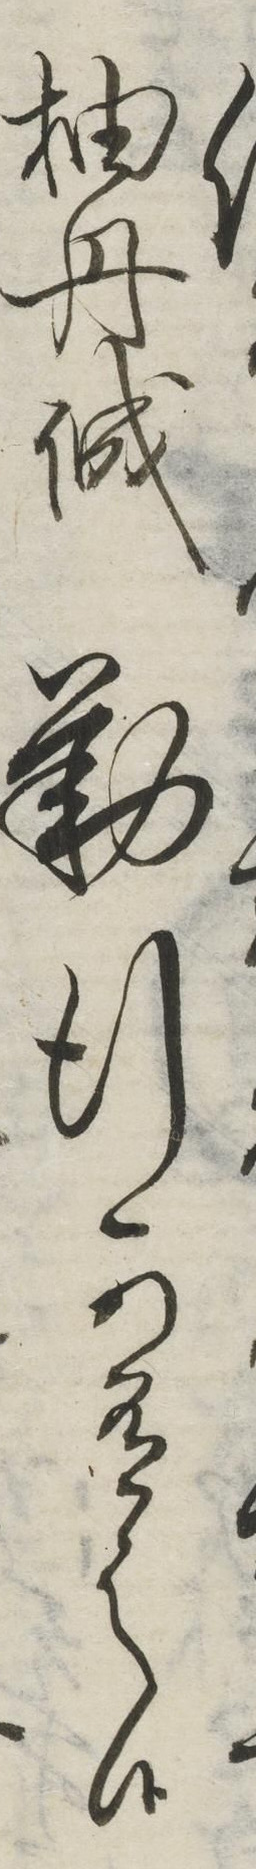抽丹誠勤行可有之候
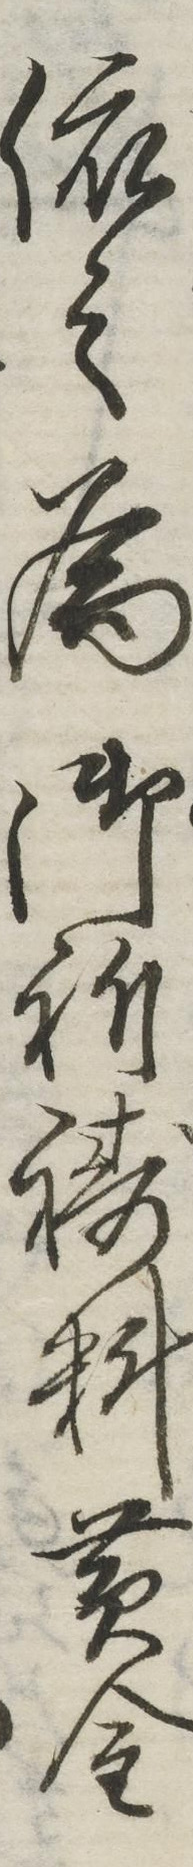依之為御祈祷料黄金
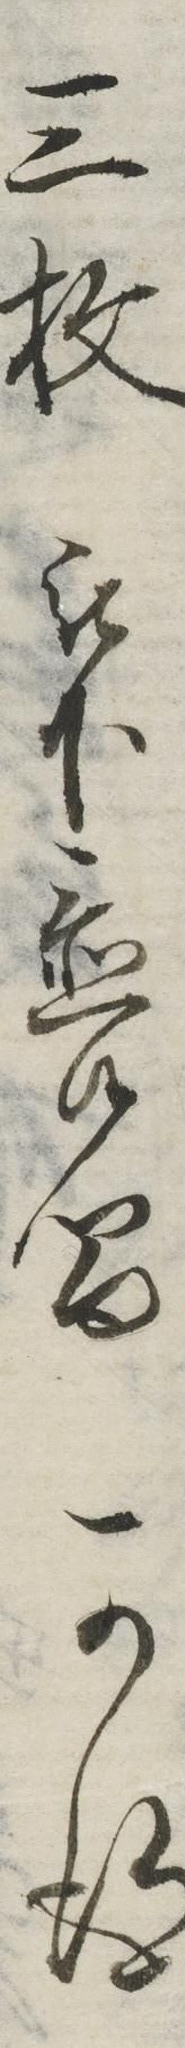三枚被下置候間可得
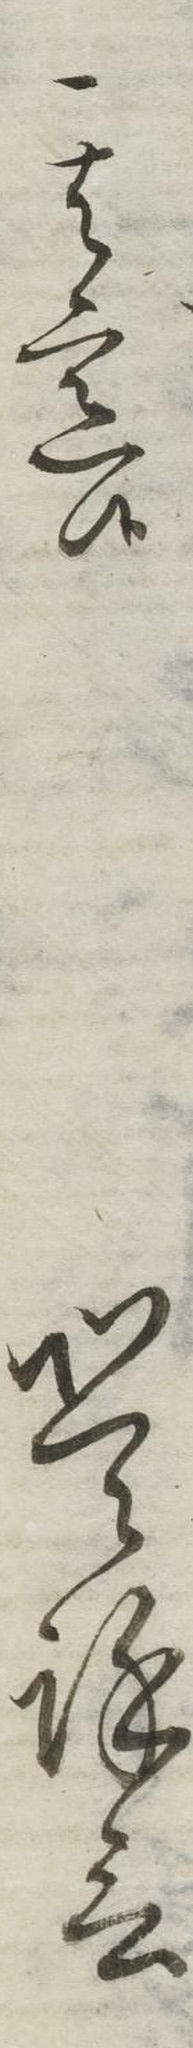其意候恐〻謹言
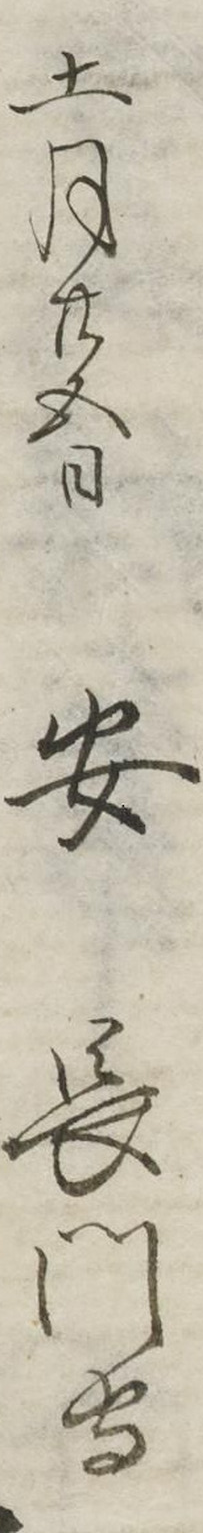十一月廿五日安長門守
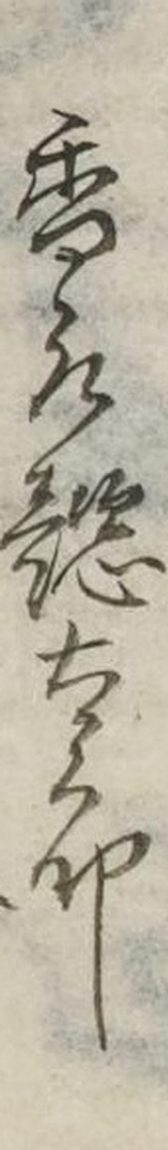香取懿太郎
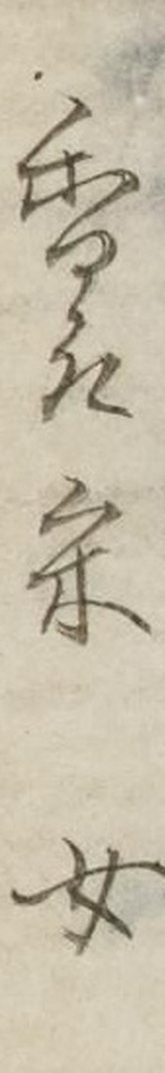香取采女

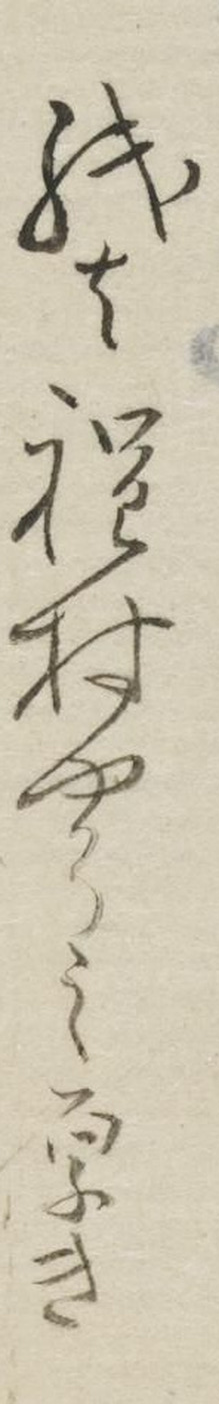紙は程村ゆかり之厚き
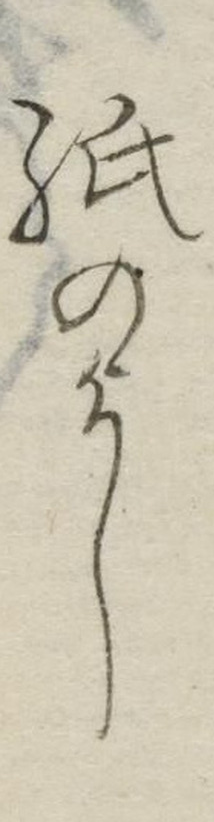紙のよし
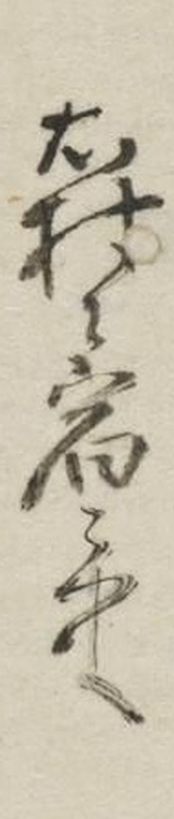右村〻宿〻中へ
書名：大地震實録
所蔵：東京大学地震研究所図書室 Earthquake Research Institute Library, The University of Tokyo, JAPAN
